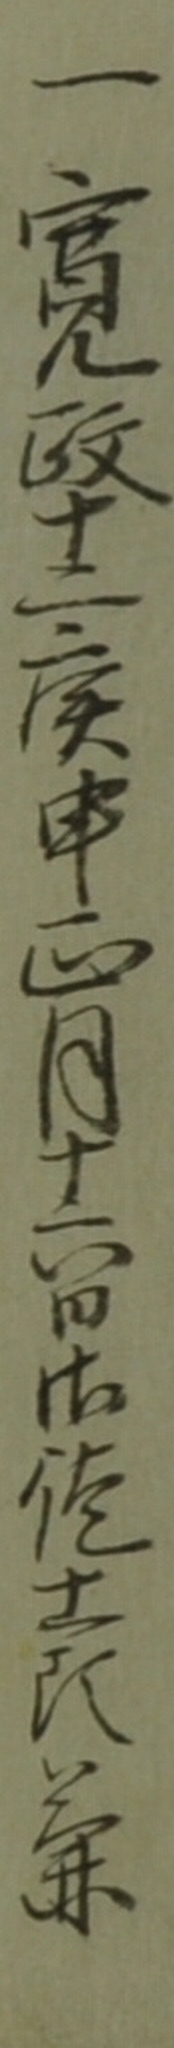一寛政十二庚申正月十六日御徒士頭兼
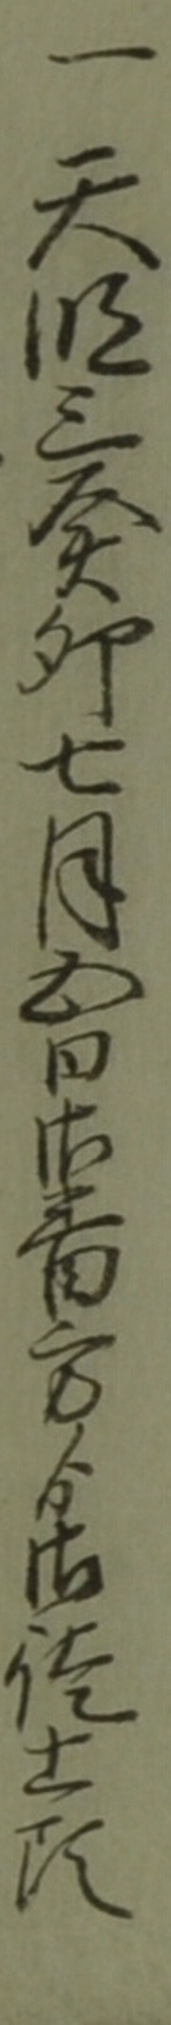一天明三癸卯七月五日御番方ゟ御徒士頭
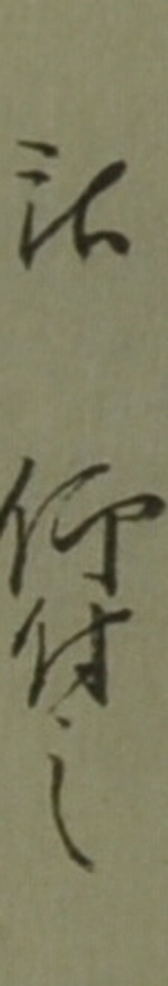被仰付之
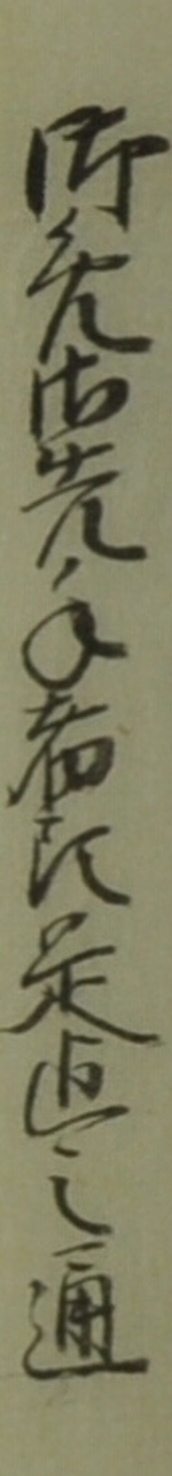御免御先手者頭是迄之通

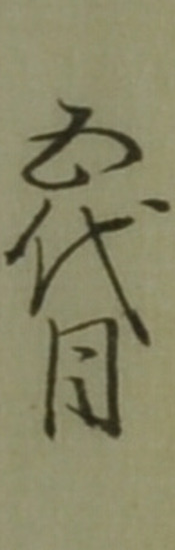五代目
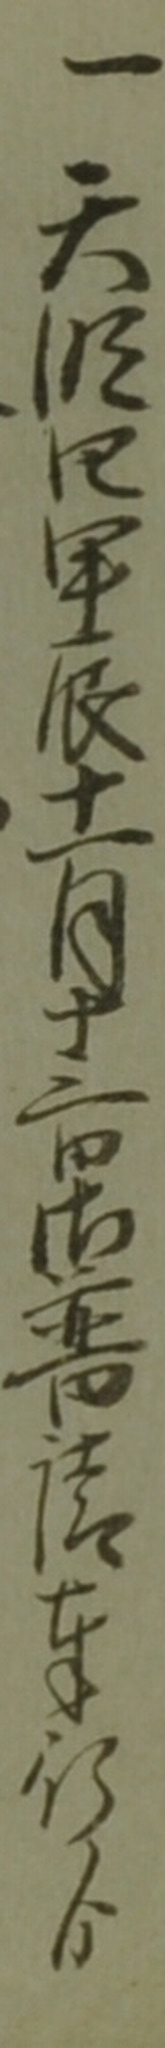一天明四甲辰十一月十三日御普請奉行ゟ
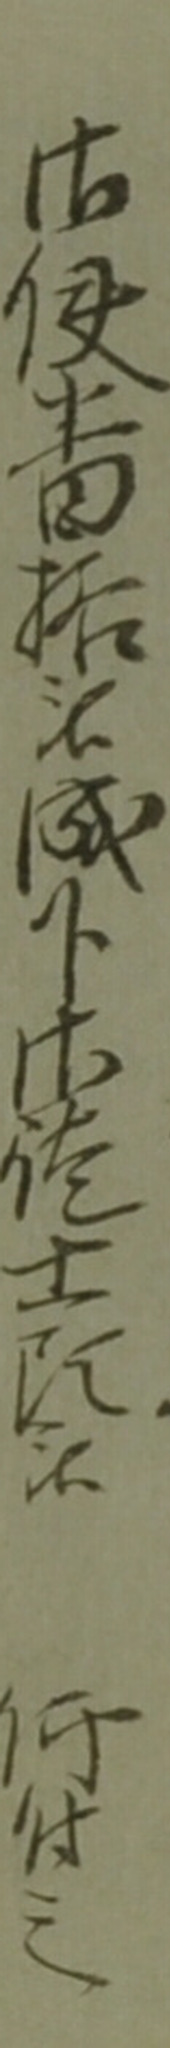御使番格被成下御徒士頭被仰付之
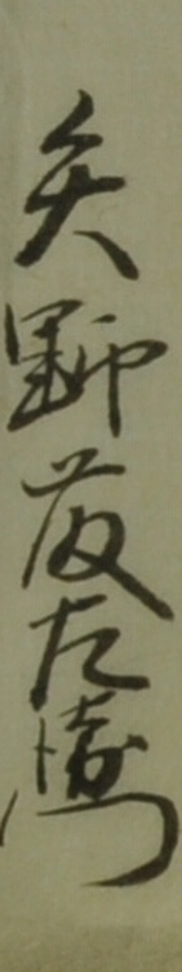矢野藤左衛門
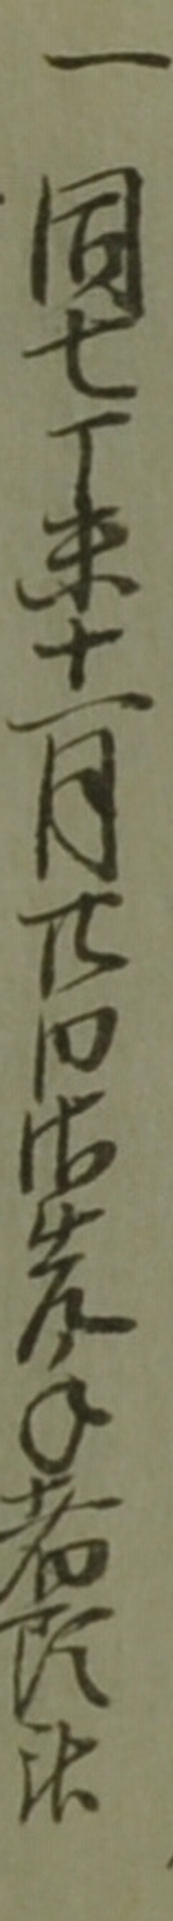一同七丁未十一月廿日御先手者頭被
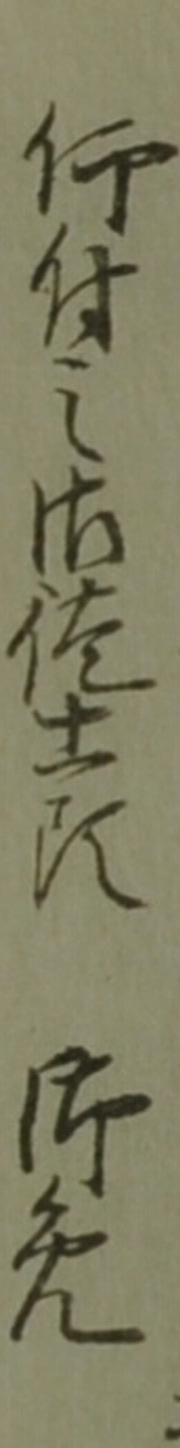仰付之御徒士頭御免
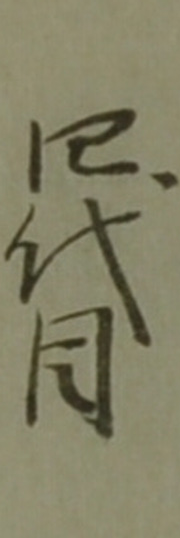四代目
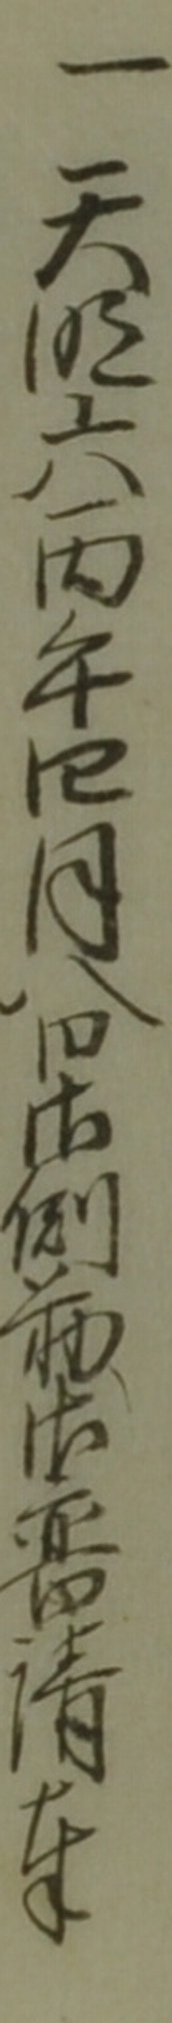一天明六丙午四月八日御側勤御普請奉
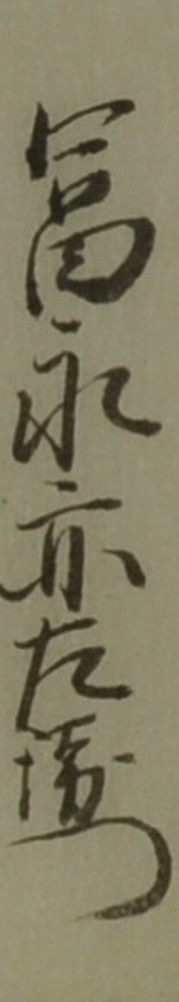冨永亦左衛門
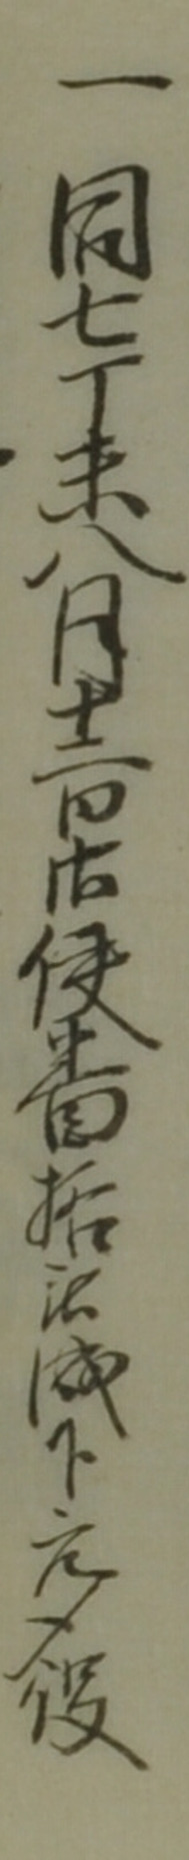一同七丁未八月十二日御使番格被成下元〆役
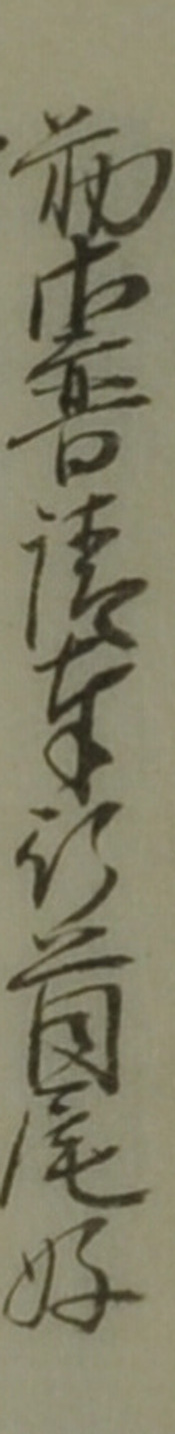勤御普請奉行首尾好
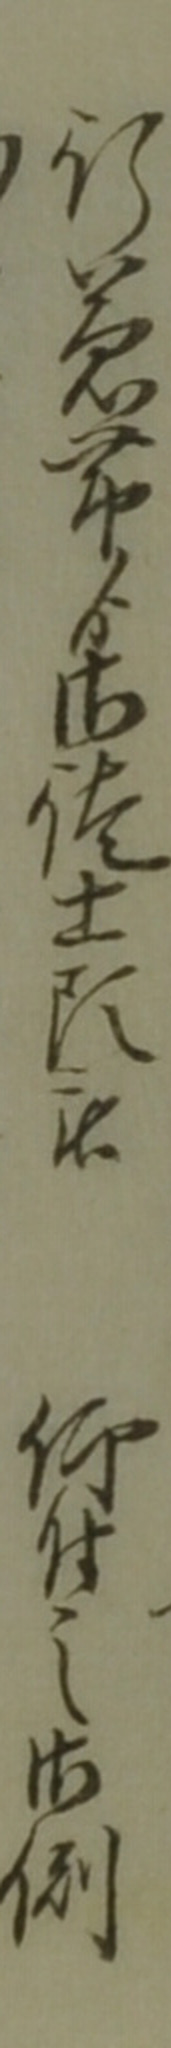行兼帯ゟ御徒士頭被仰付之御側
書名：諸御役代々録（六）
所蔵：伊那市立高遠町図書館・合同会社AMANE
